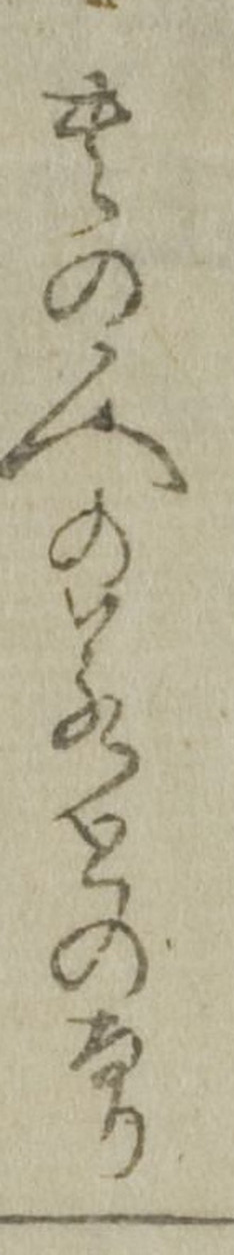貴の人の若とのなり
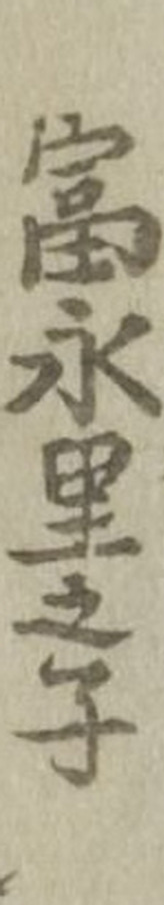富永里之子
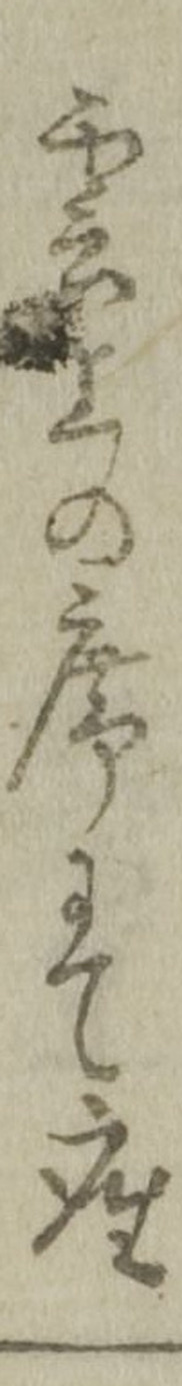雲上の席にて座
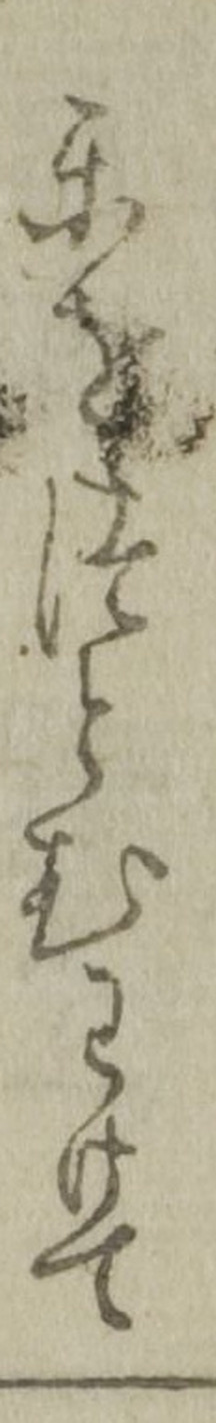楽をつとむわけて
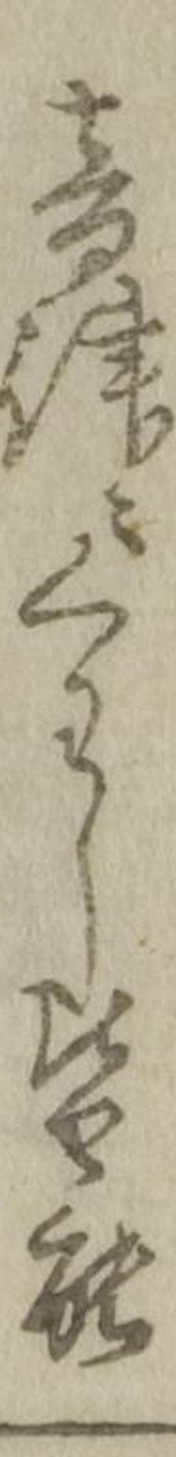音律にくわし皆能
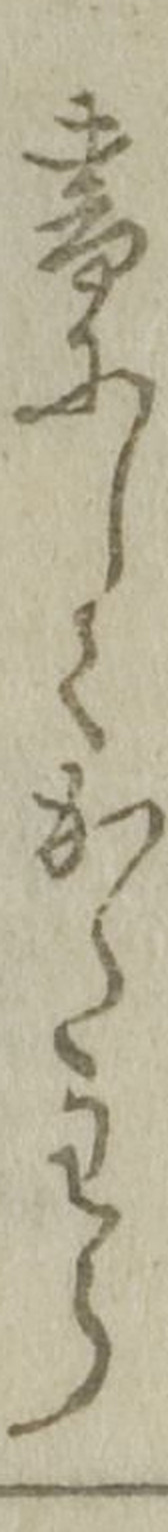書にしてかたわら
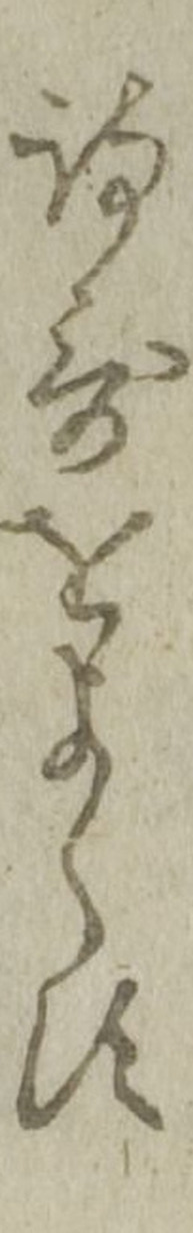詞歌をよらす
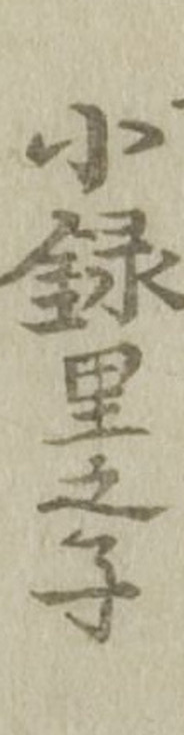小録里之子
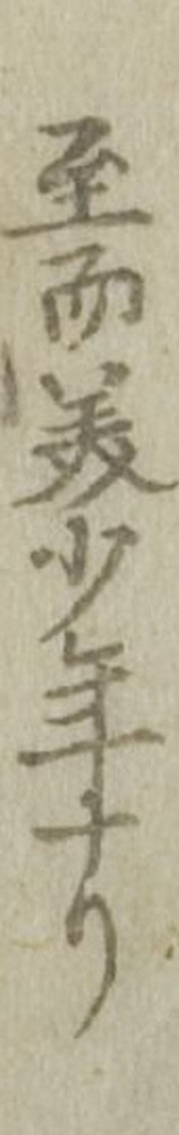至而美少年ナリ

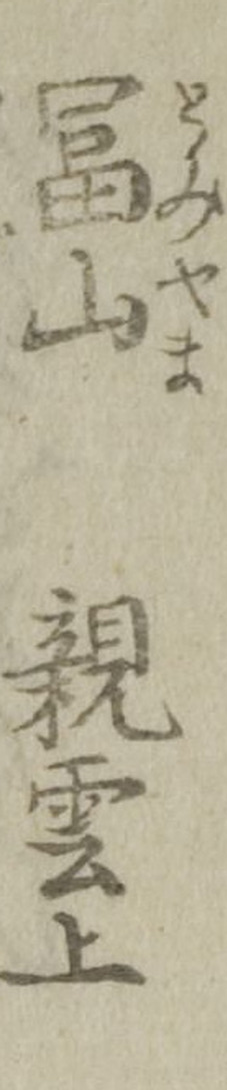冨山親雲上
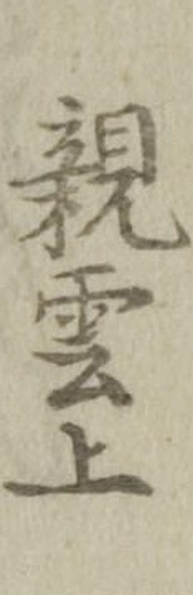冨山親雲上
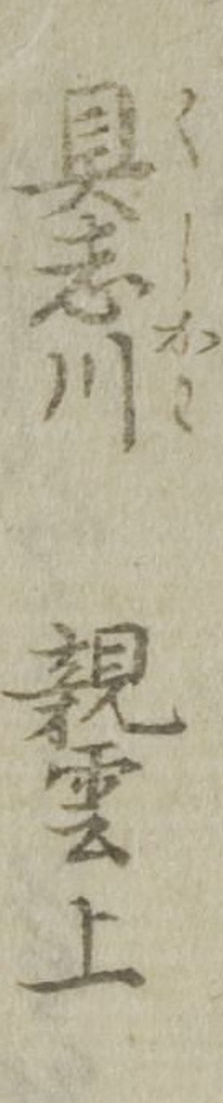具志川親雲上
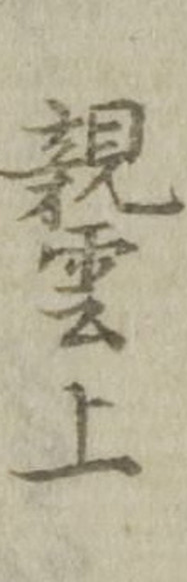冨山親雲上
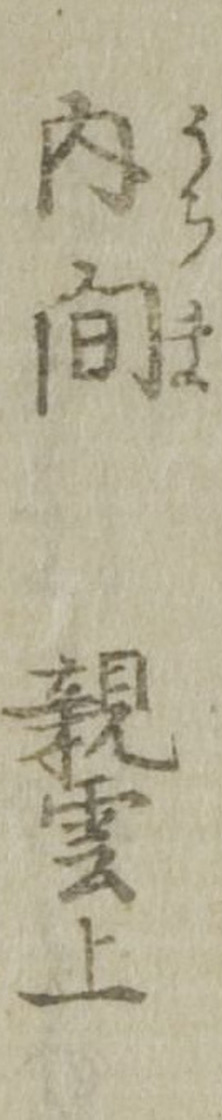内間親雲上
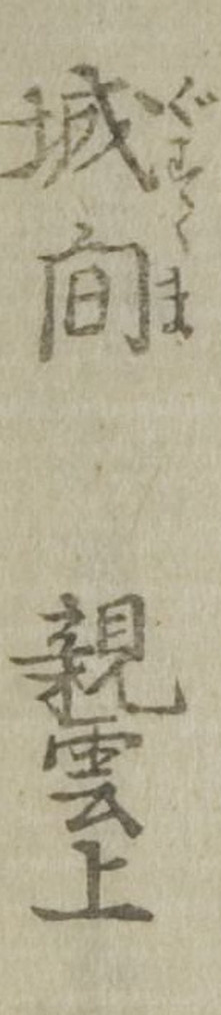城間親雲上
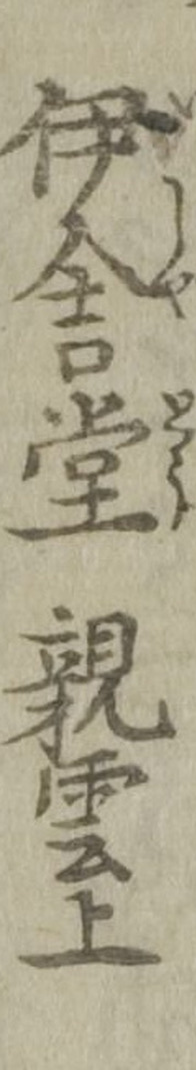伊舎堂親雲上
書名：琉球人行列記 天保3年
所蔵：University of the Ryukyus Library
